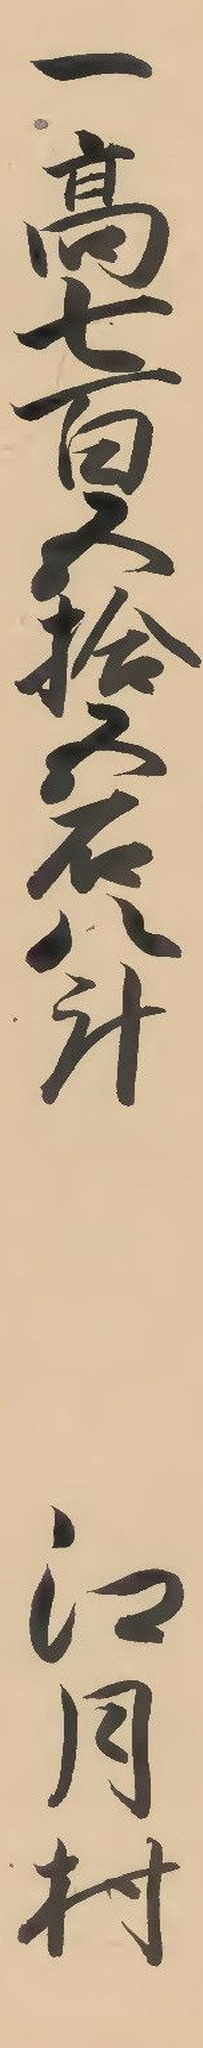一高七百五拾五石八斗江月村
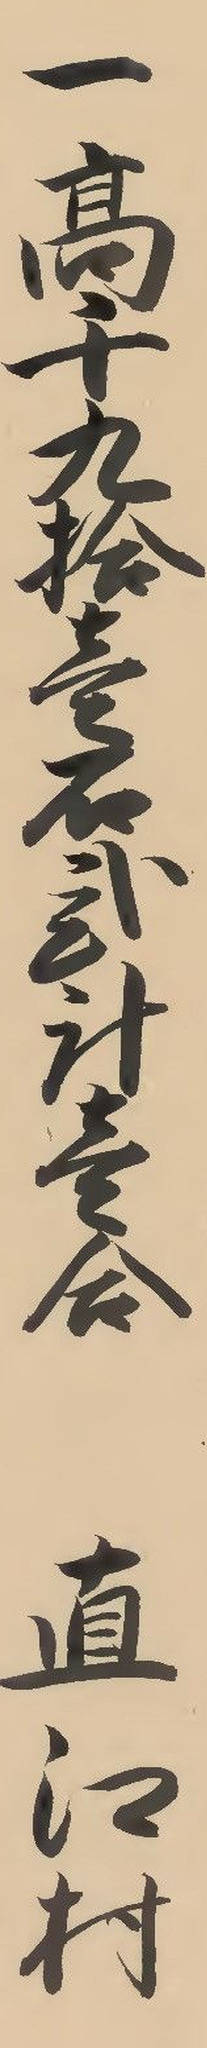一高千九拾壱石弐斗壱合直江村
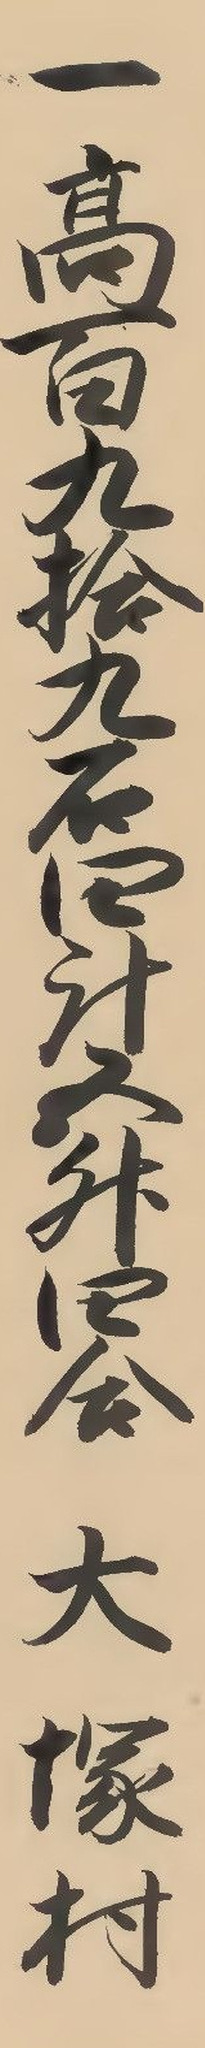一高百九拾九石四斗五升四合大塚村
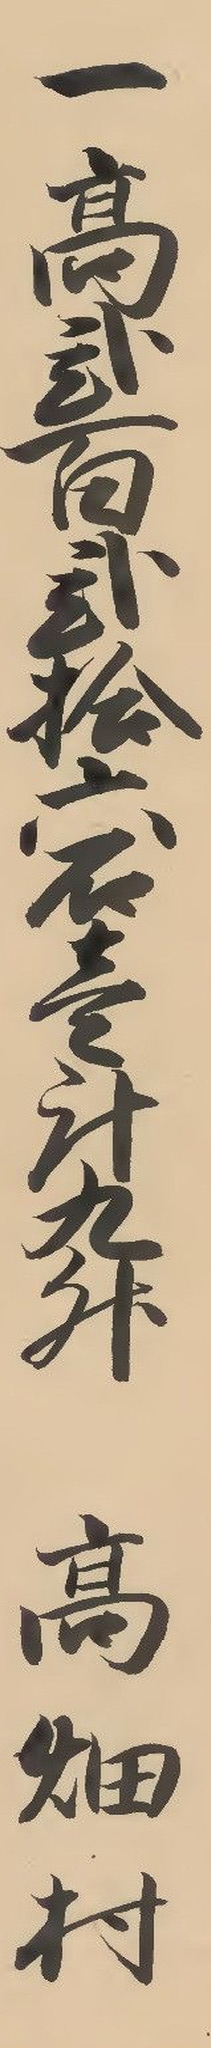一高弐百弐拾六石壱斗九升高畑村
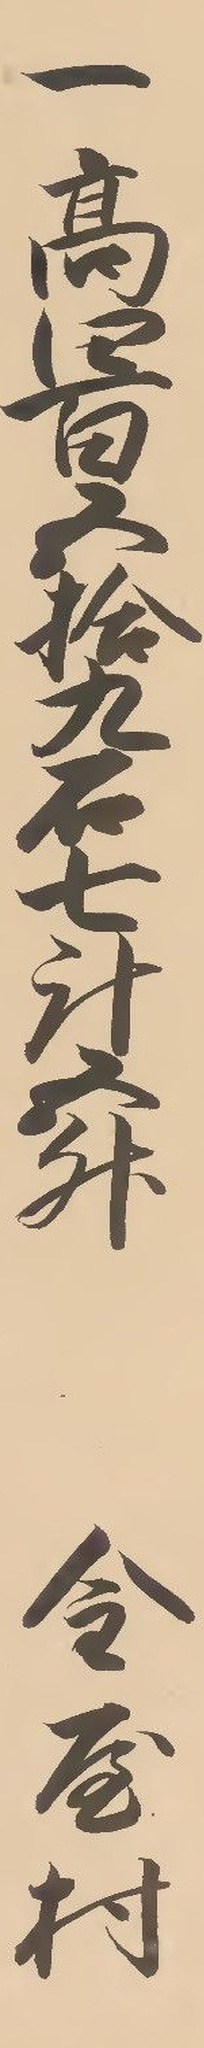一高四百五拾九石七斗五升金屋村
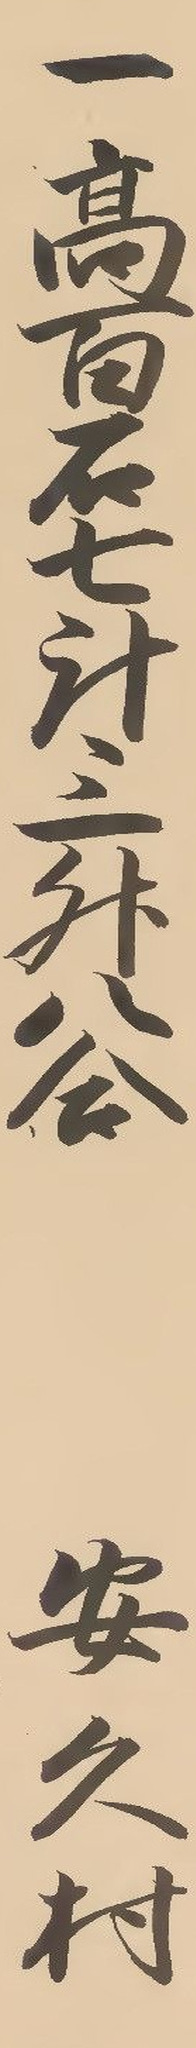一高百石七斗三升八合安久村
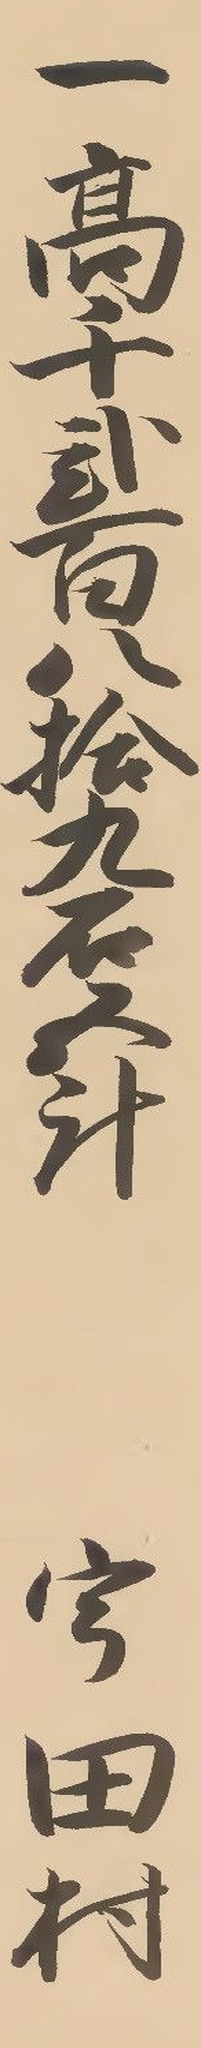一高千弐百八拾九石五斗宇田村
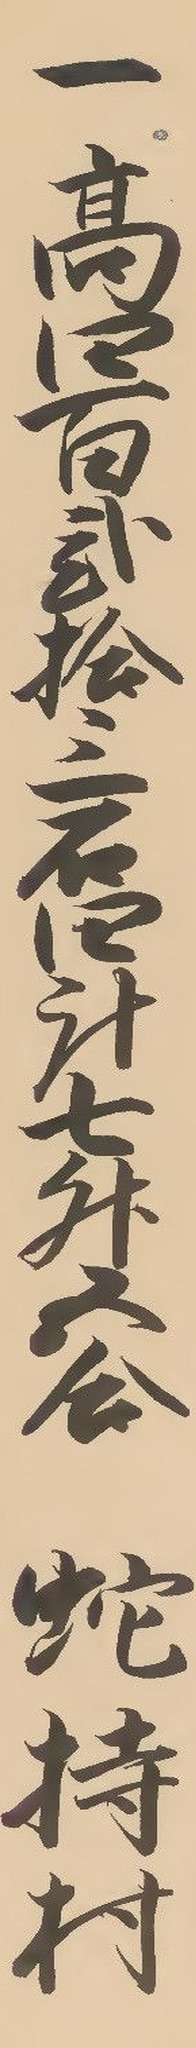一高四百弐拾三石四斗七升五合蛇持村

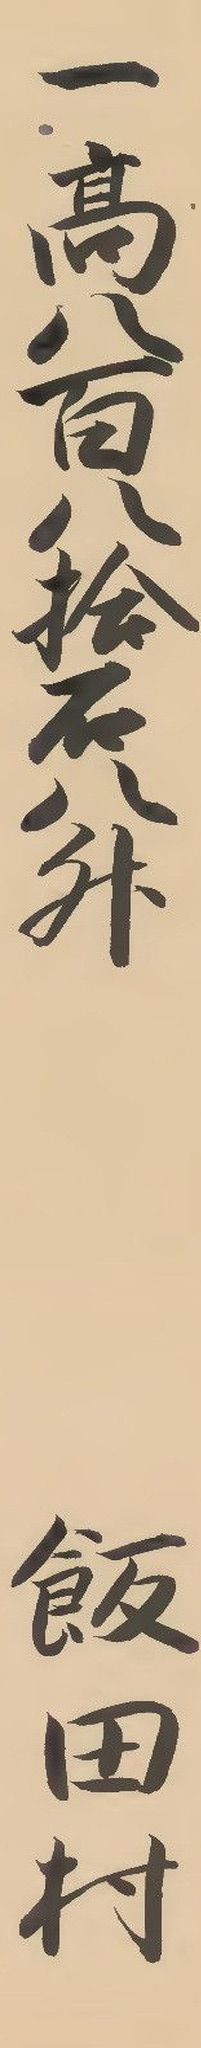一高八百八拾石八升飯田村
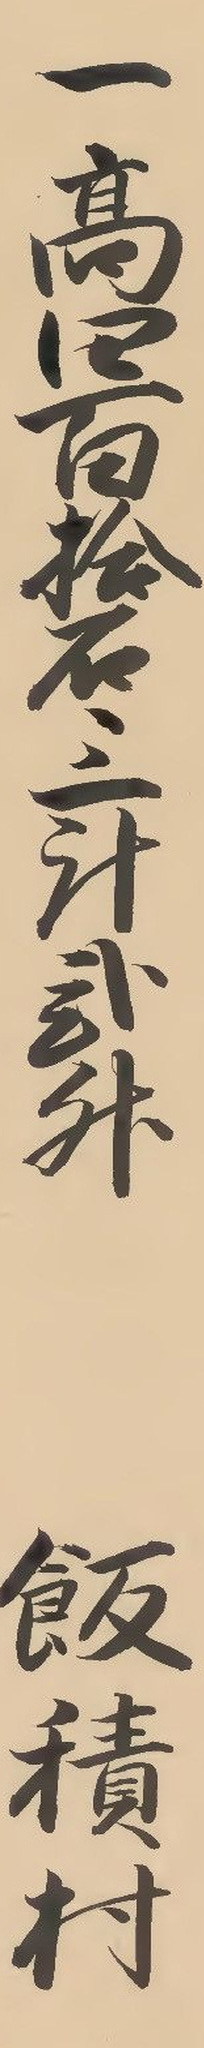一高四百拾石三斗弐升飯積村
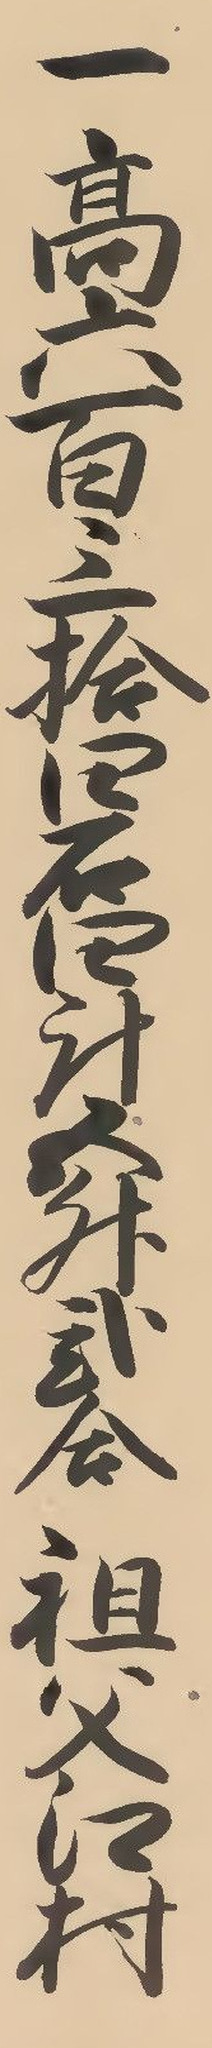一高六百三拾四石四斗五升弐合祖父江村
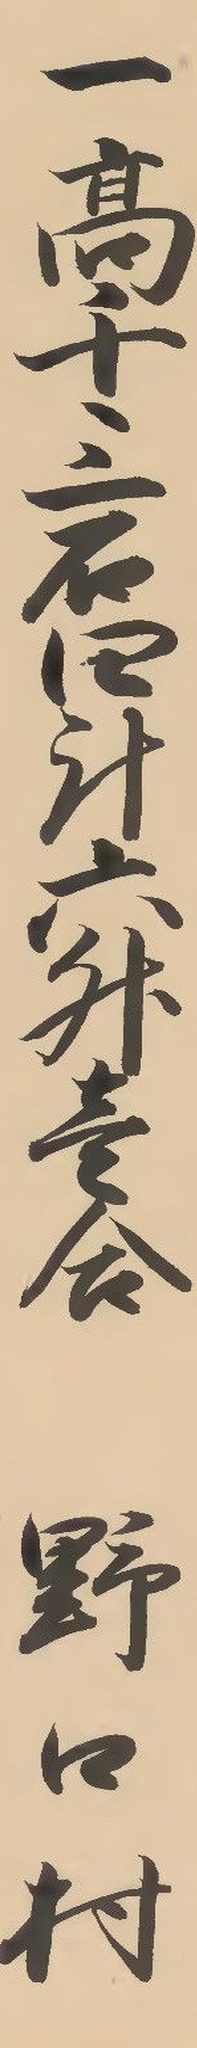一高千三石四斗六升壱合野口村
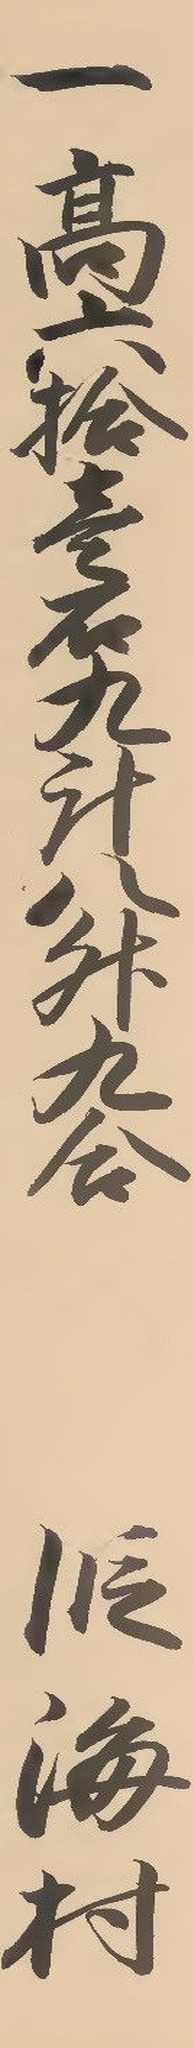一高六拾壱石九斗八升九合段海村
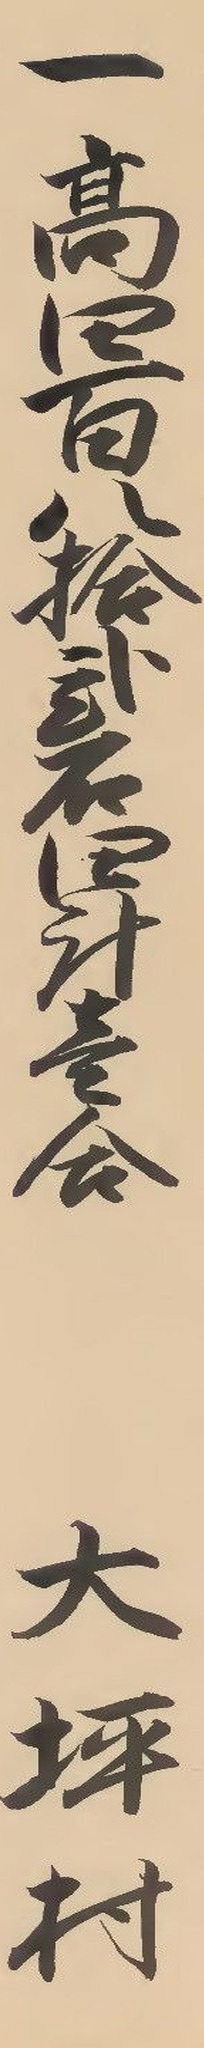一高四百八拾弐石四斗壱合大坪村
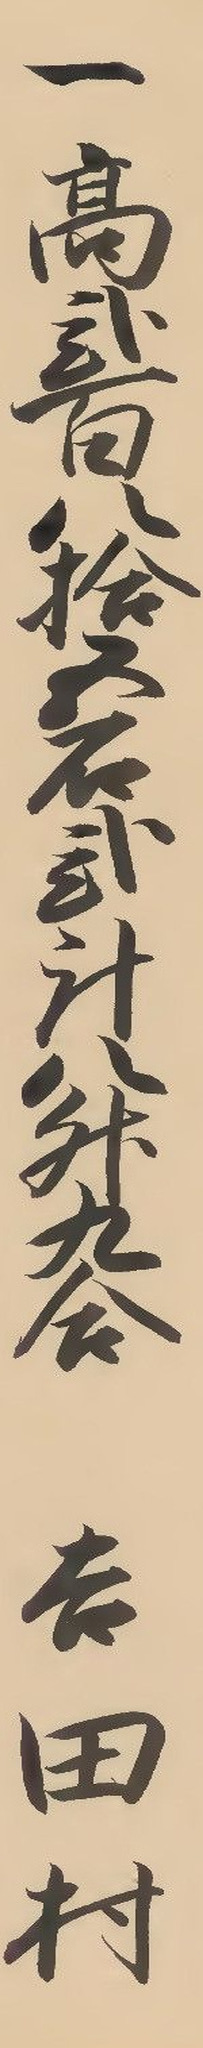一高弐百八拾五石弐斗八升九合吉田村
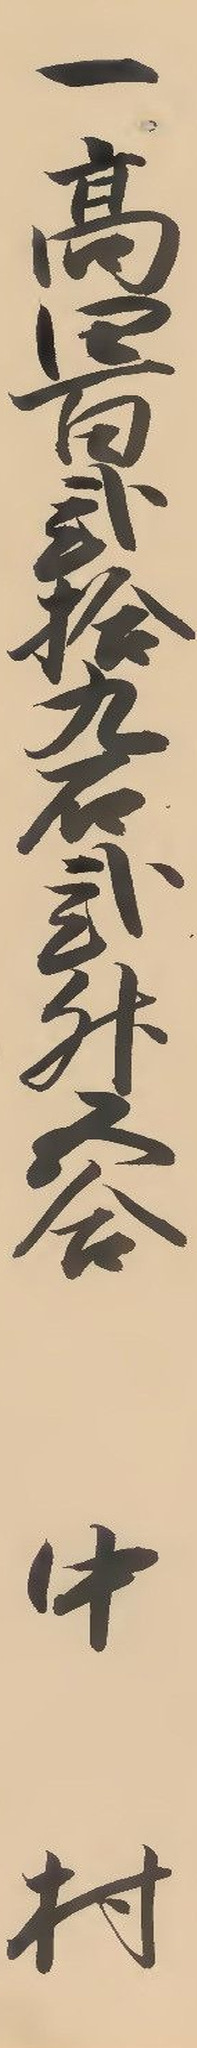一高四百弐拾九石弐升五合中村
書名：美濃国郷帳
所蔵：国立公文書館 National Archives of Japan
